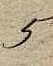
5
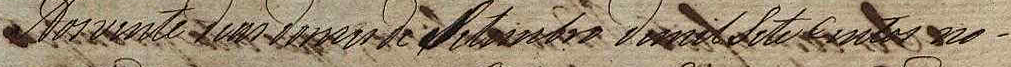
Aos vinte dias do mes de Setembro de mil SeteCentos no
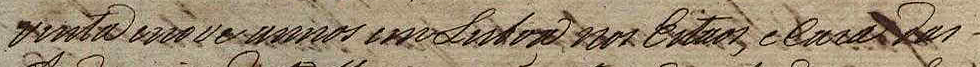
venta e nove annos em Lisboa, nos Estaos, e Caza das
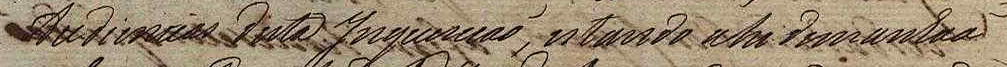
Audiencias desta Jnaquizicaõ, estando ahi de manhaã
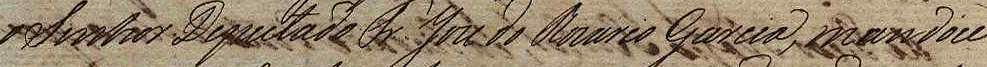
o Senhor Deputado Fr Joze do Rozario Garcia, mandou
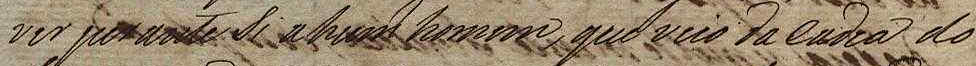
vir perante Si a hum homem, que veio da cadea do
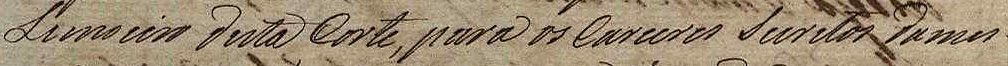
Limoeiro desta Corte, para os Carceres Secretos da mes
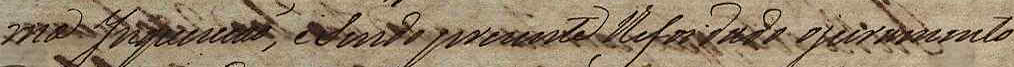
ma Jnquizicaõ, e Sendo prezente lhe foi dado o juramento
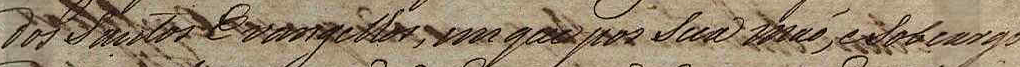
dos Santos Evangelhos, em que pos Sua maõ, e sobcargo
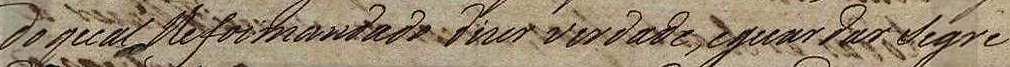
do qual lhe foi mandado dizer verdade, e guardar Segre
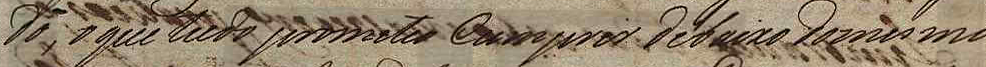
do, o que tudo prometeo Cumprir debaixo do mesmo
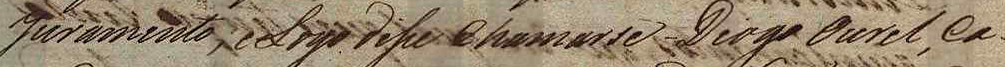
Juramento, e Logo disse chamarse Diogo Ourel, ca
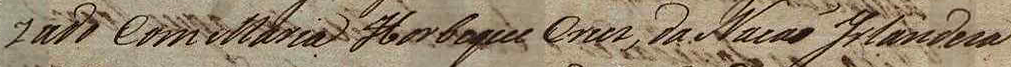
zado com Maria Horbeque Cruz, da Nacaõ Jrlandeza
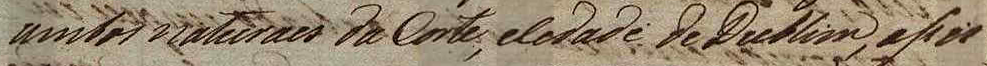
ambos naturaes da Corte, e Cidade de Dublim, assis
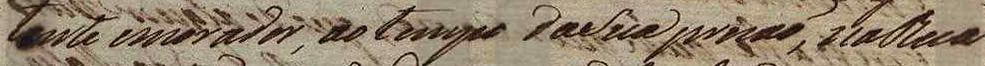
tente e morador, ao tempo da Sua prisaõ, na Rua
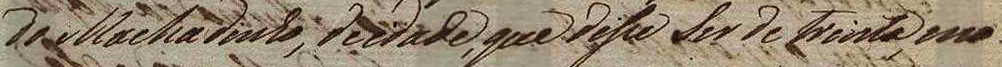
do Machadinho, de idade, que disse Ser de trinta, e no
